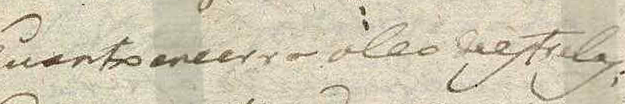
Quanto encerra o Ceo de estrelas,
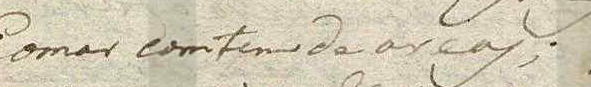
E o mar comtem de arcas;
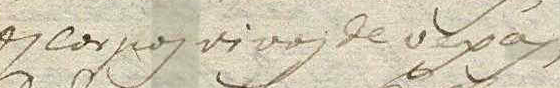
Os corpos vivos de veyas;
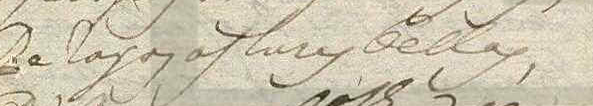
De Rayos as luzes bellas,
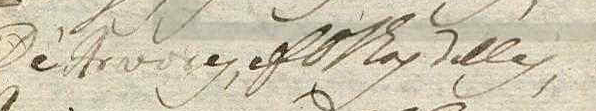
De Arvores, e folhas dellas,
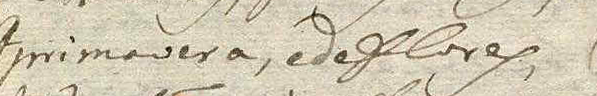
A primavera, e de flores,
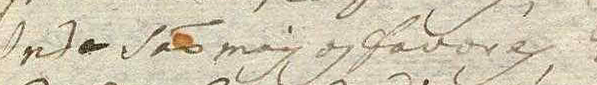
Inda são mais os favores
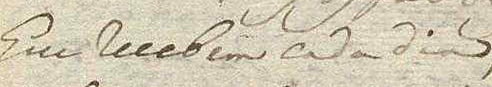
Que Recebem cada dia,
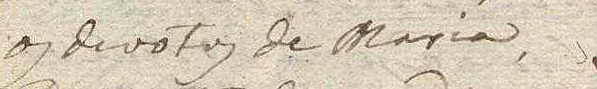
Os devotos de Maria,
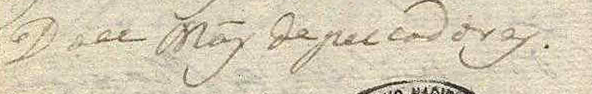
Doce Mãy de peccadores.
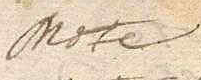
Mote
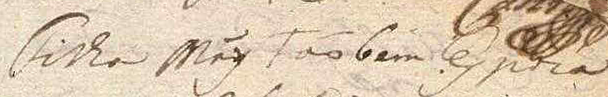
Filha mãy taõbem Espoza
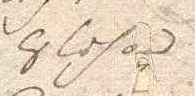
Glosa
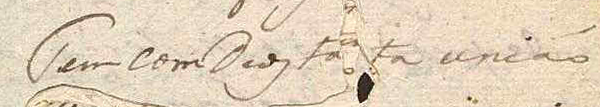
Tem com Deos ta_ta uniaõ
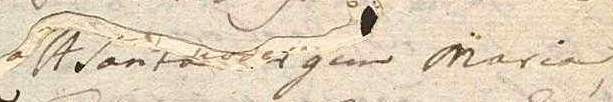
A Santa __ rgem Maria
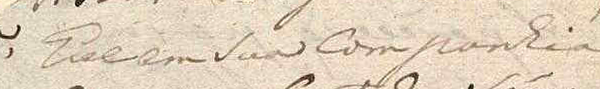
Que em Sua Companhia,
